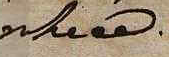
nhece.
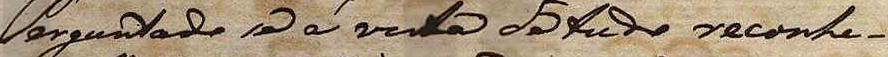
Perguntado se á vista de tudo reconhe
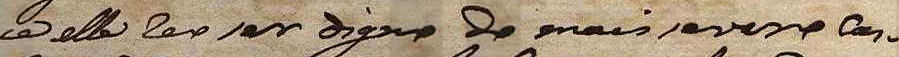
ce elle Reo ser digno do mais severo cas
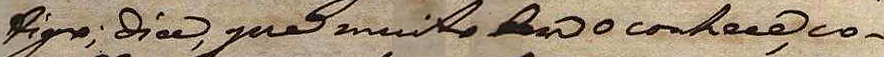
tigo; dice, que muito bem o conhece, co
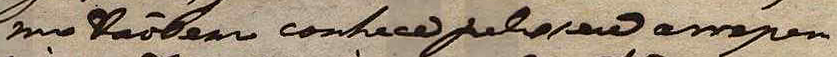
mo taõbem conhece pelo seu arrepen
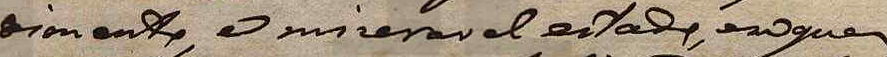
dimento, e mizeravel estado, em que
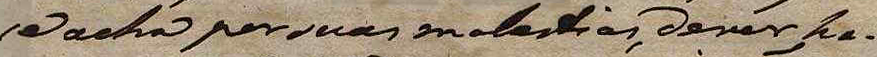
se acha per suas molestias, dever ha
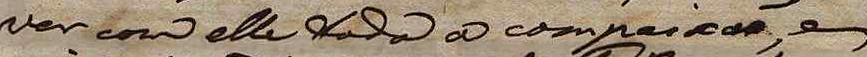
ver com elle toda a compaixaõ, e
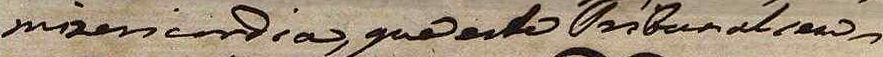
mizericordia, que este Tribunal sem
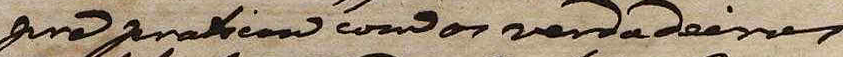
pre praticou com os verdadeiros
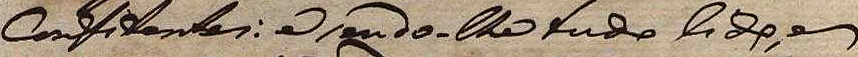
Confitentes: e sendo-lhe tudo lido, e
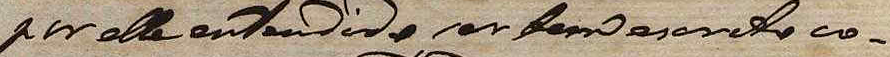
por elle entendido, ser bem escrito co
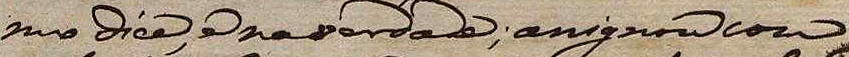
mo dice, e na verdade; assignou com
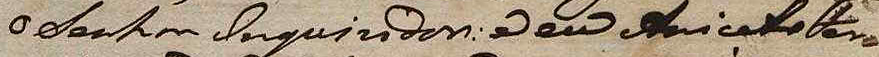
o Senhor Inquizidor: e eu Aniceto Fer
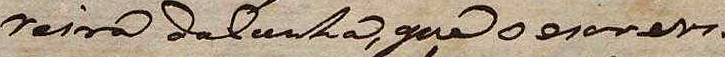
reira da Cunha. que o escrevi.
